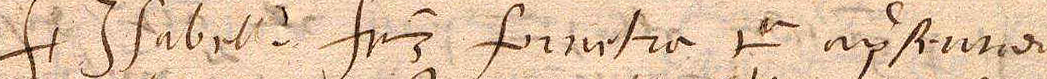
Jt Jsabell frz̄ fornejra ta ap̄sentada
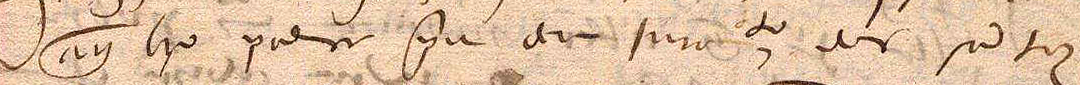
a q̄ ho padre pior deu juramto dos sātꝯ
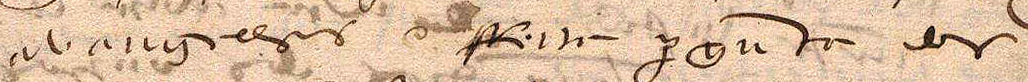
avangelhos e feita ꝑgūta dos
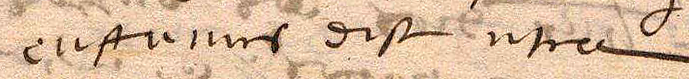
custumes dise njcll
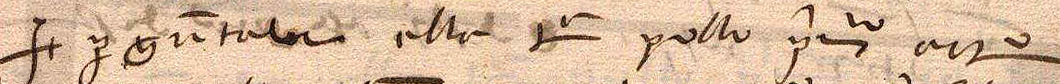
Jt ꝑgūtada ella ta pollo pimro arto
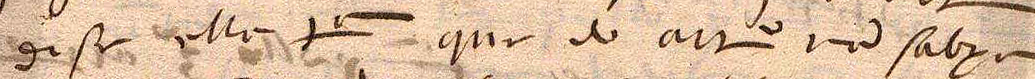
dise ella ta que do arto nā sabya
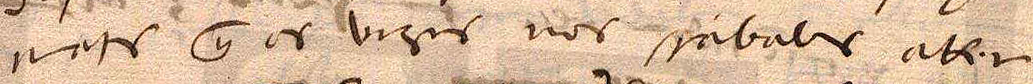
mais q̄ as vezes nos ssabados a Ree
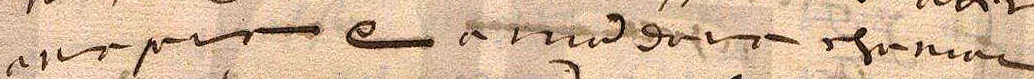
amasaua e a mādaua chamar
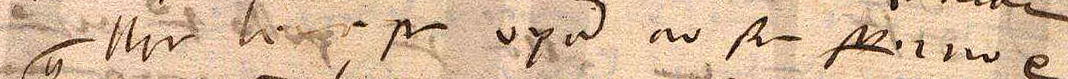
q̄ lhe leuase o pā ao seu forno e
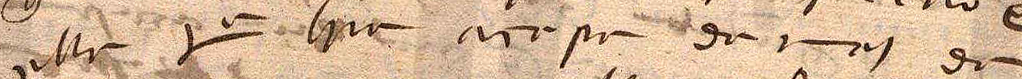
ella ta hia a casa da maj da
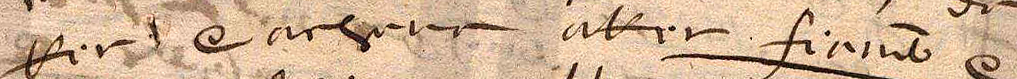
Ree e achaua a Ree fiando e
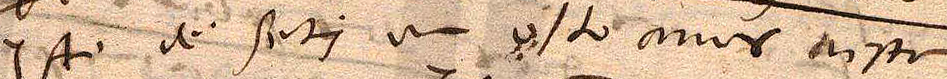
Jsto de sete ou ojto anos a esta
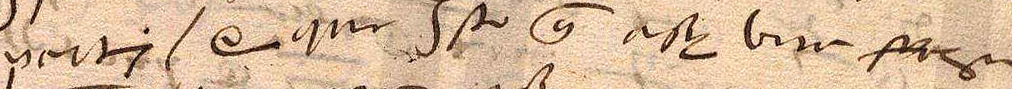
parte / e que Jsto q̄ asy vira fazer
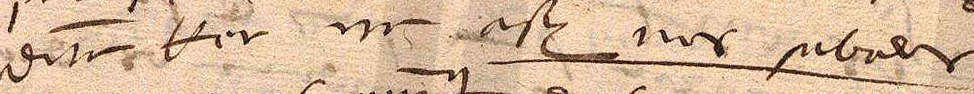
a dita Ree era asy nos sabados
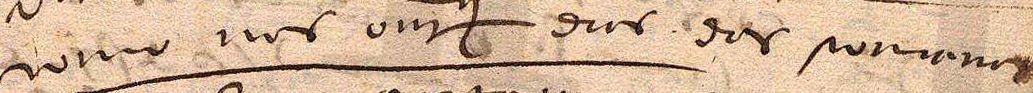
como nos outrꝯ dias das somanas
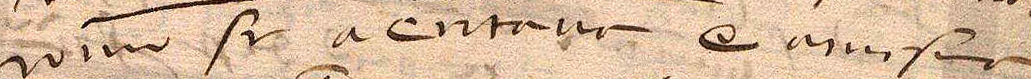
como se acertaua e a mesma
